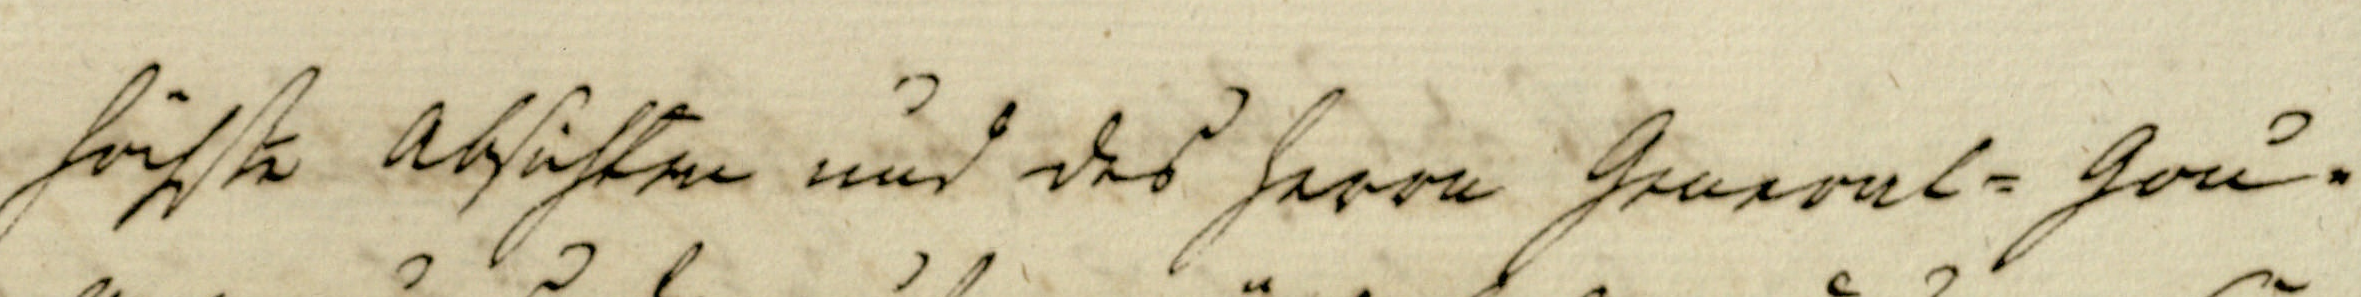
höchste Absichten und des Herrn General- Gou¬
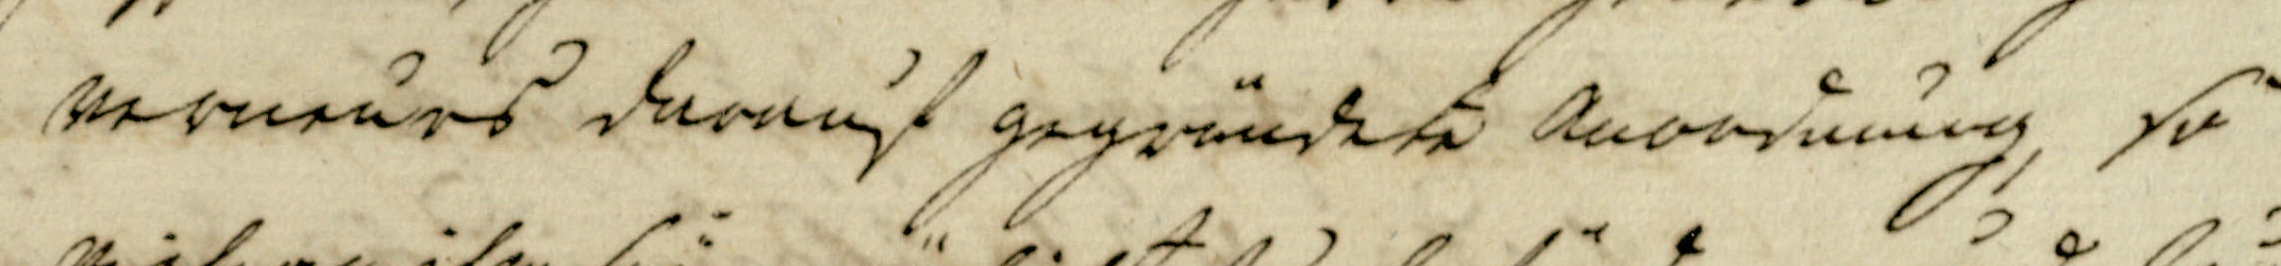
verneurs darauf gegründete Anordnung, so
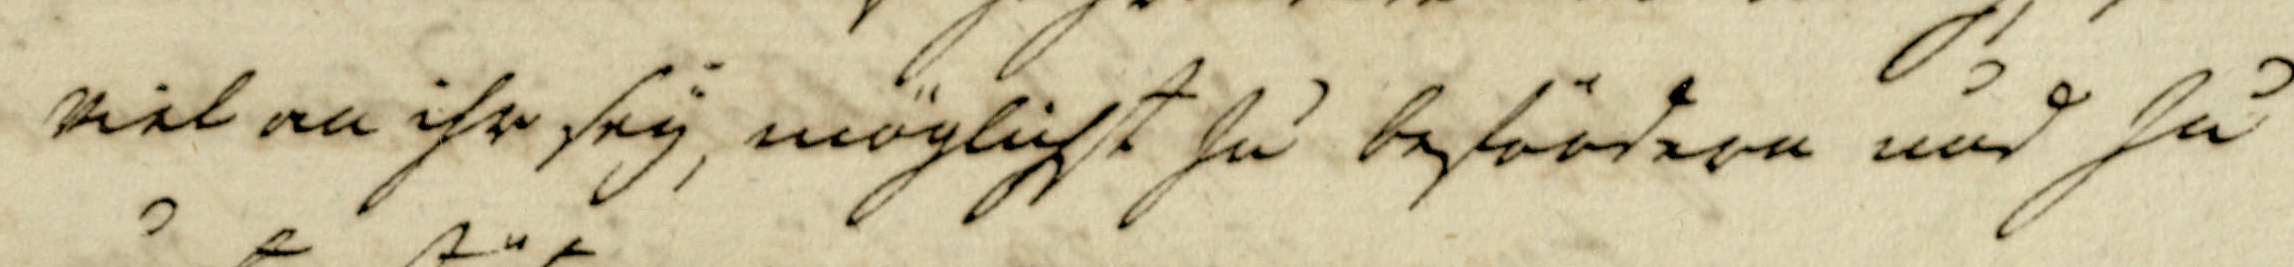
viel an ihr seÿ, möglichst zu befördern und zu
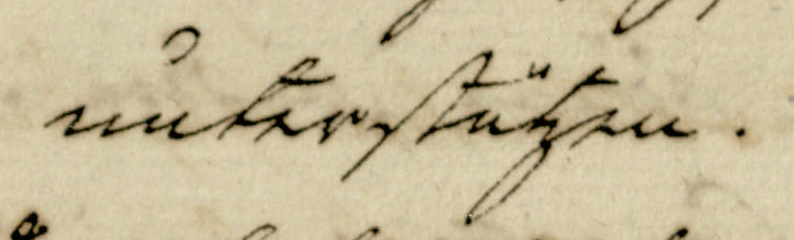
unterstützen.
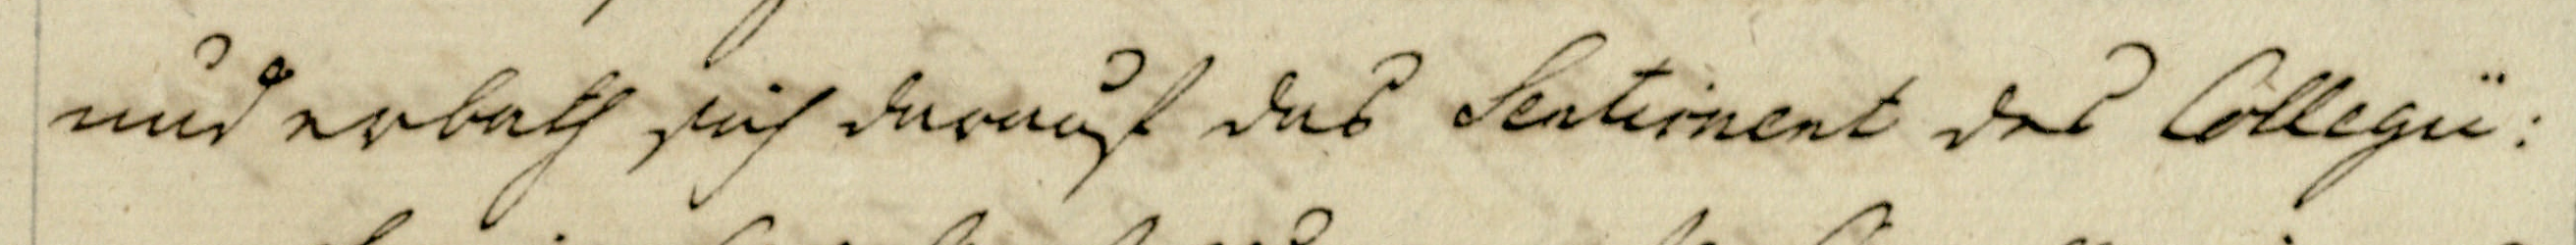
und erbath sich darauf das Sentiment des Collegii:
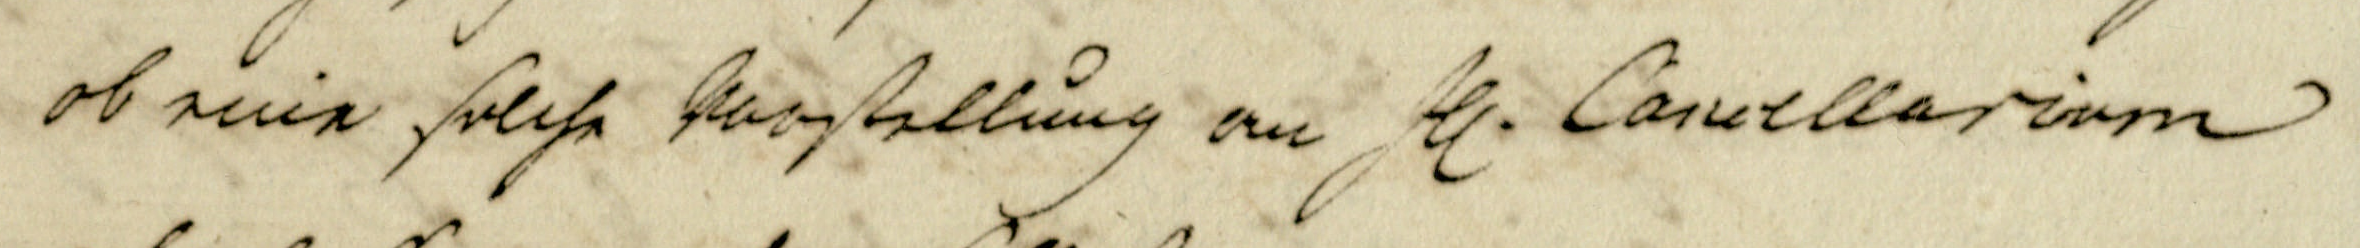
ob eine solche Vorstellung an Ill. Cancellarium
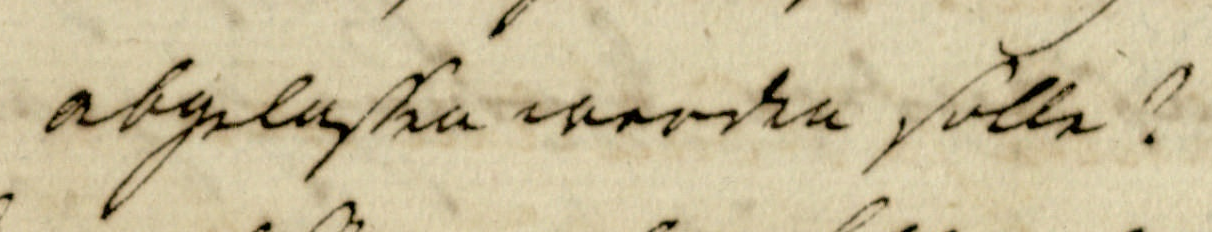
abgelassen werden solle?
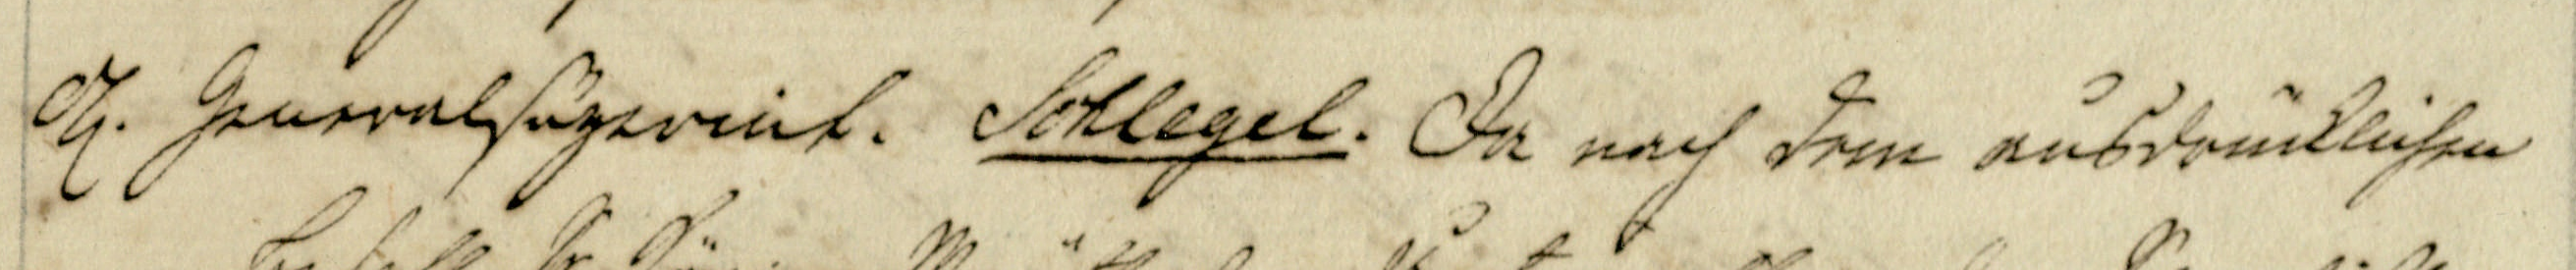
dh. Generalsuperint. Schlegel. Da nach dem ausrücklichen
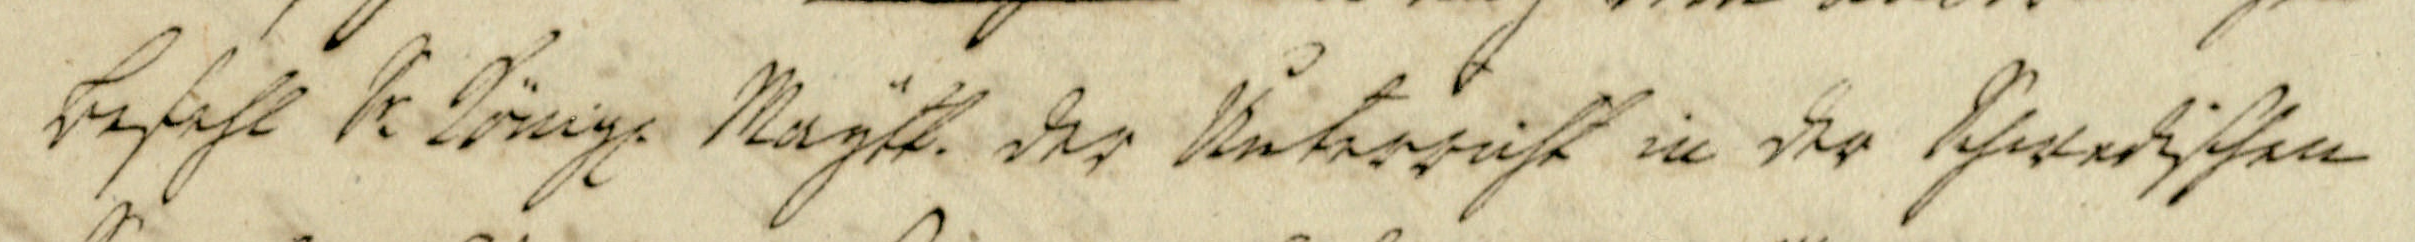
Befehl Sr Königl. Maÿtt. der Unterricht in der Schwedischen
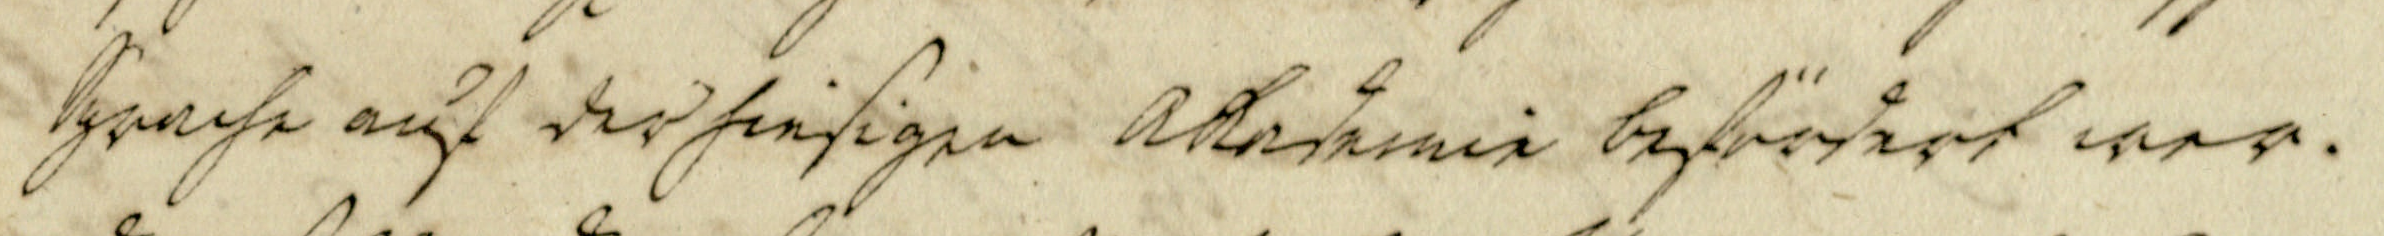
Sprache auf der hiesigen Akademie befördert wer¬
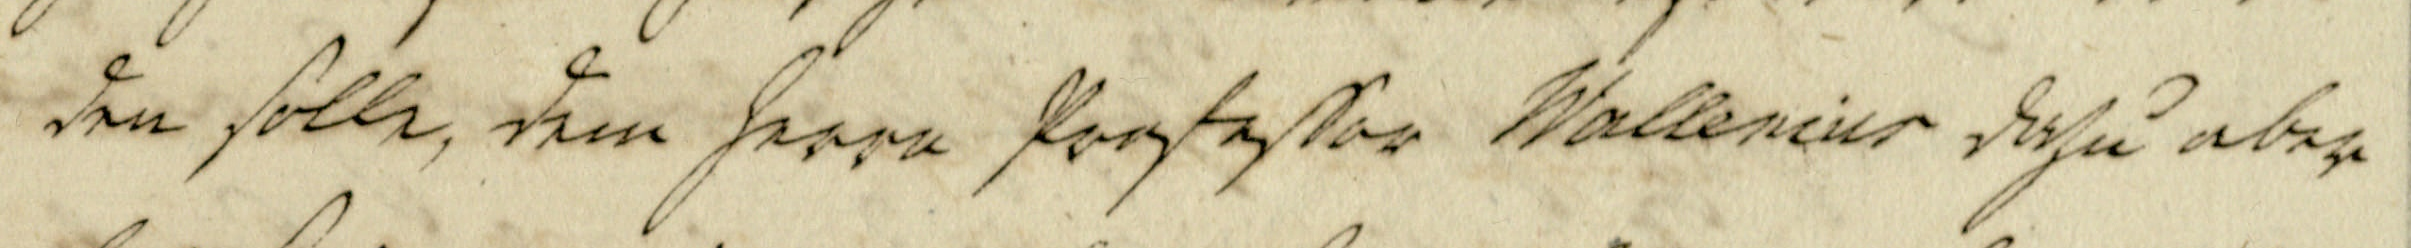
den solle, dem Herrn Professor Wallenius dazu aber
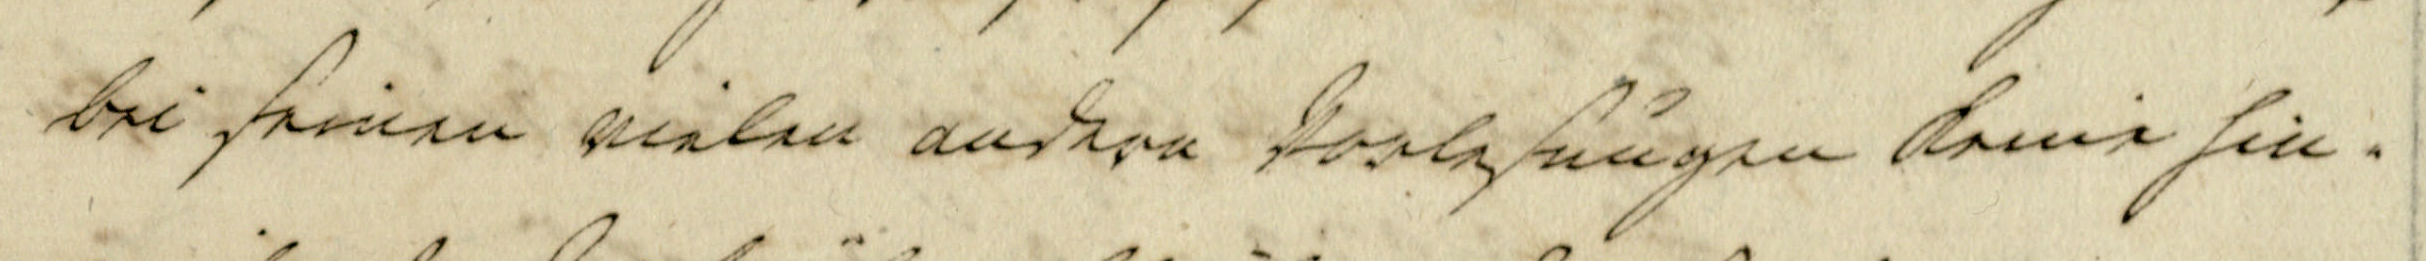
bei seinen vielen andern Vorlesungen keine hin¬
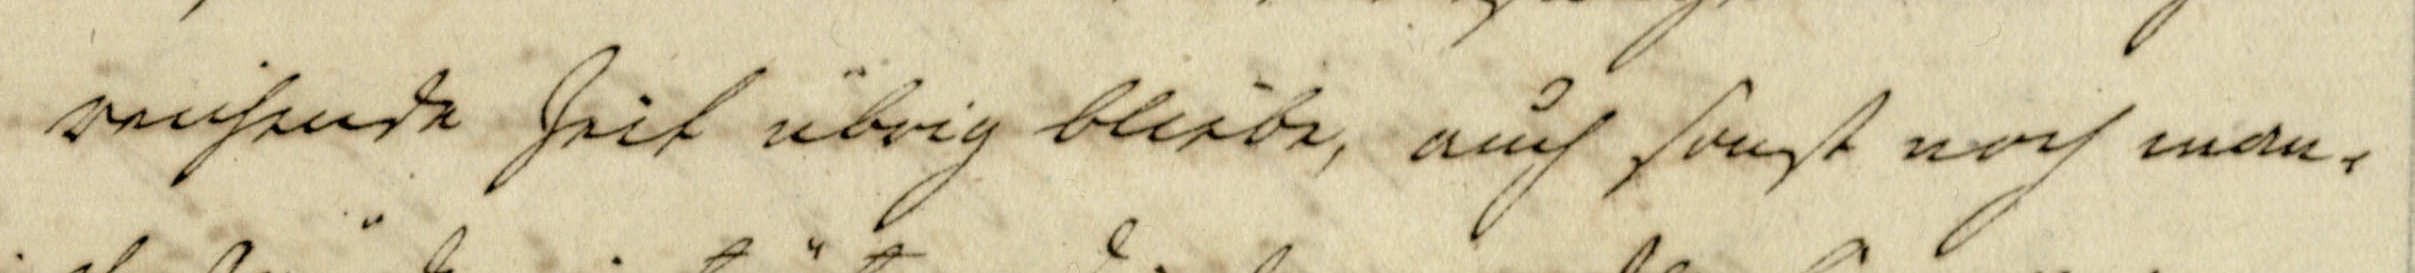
reichende Zeit übrig bliebe, auch sonst noch man¬
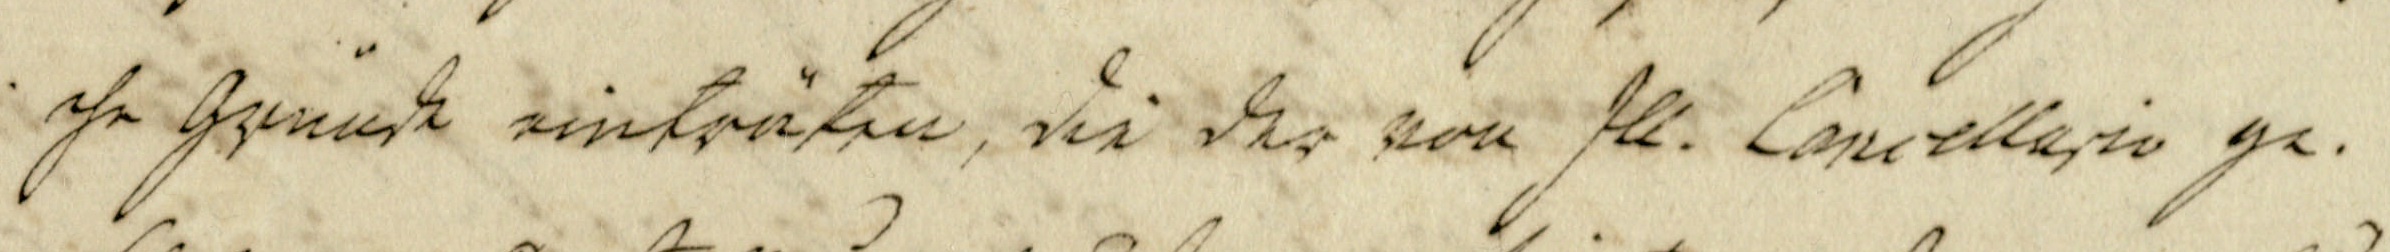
che Gründe einträten, die der von Ill. Cancellario ge¬
